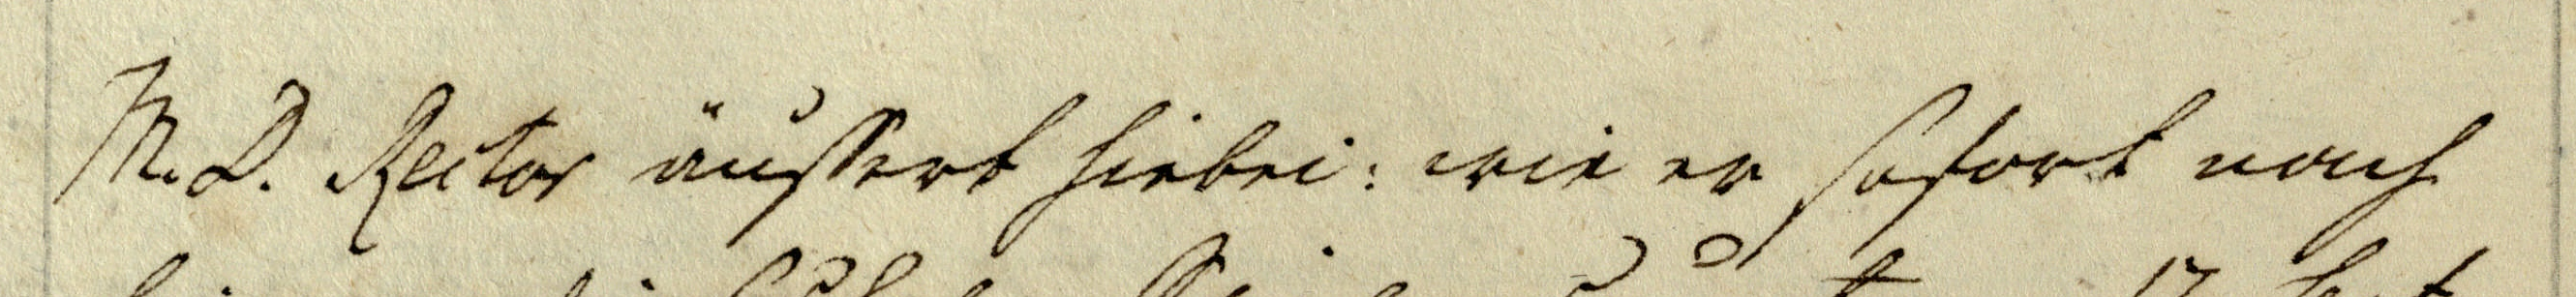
M. D. Rector äussert hiebei: wie er sofort nach
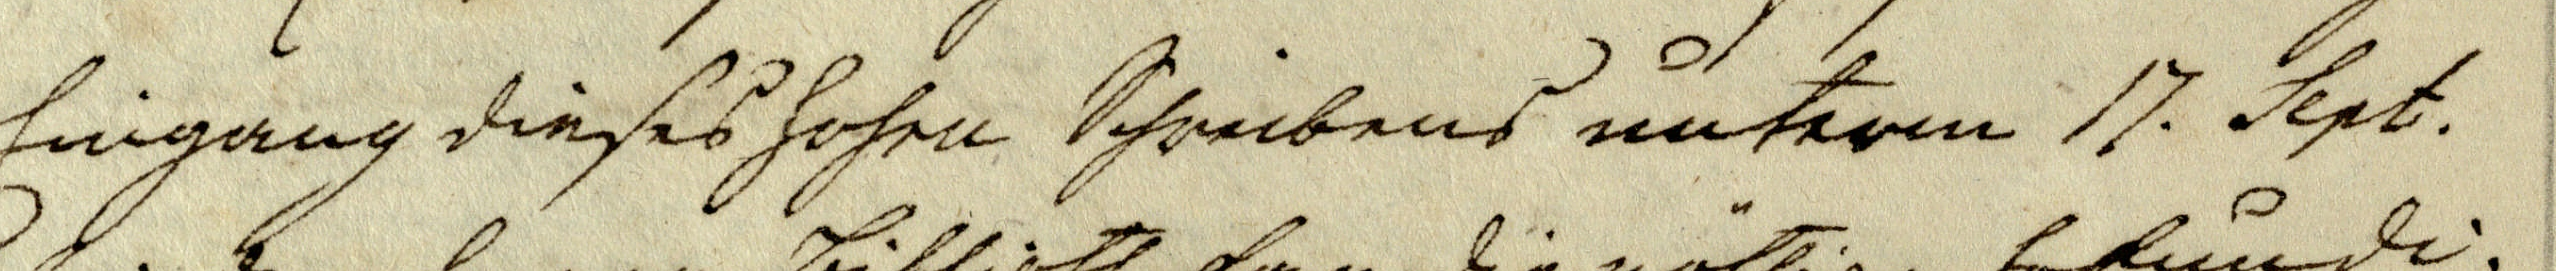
Eingang dieses Hohen Schreibens unterm 17. Sept.
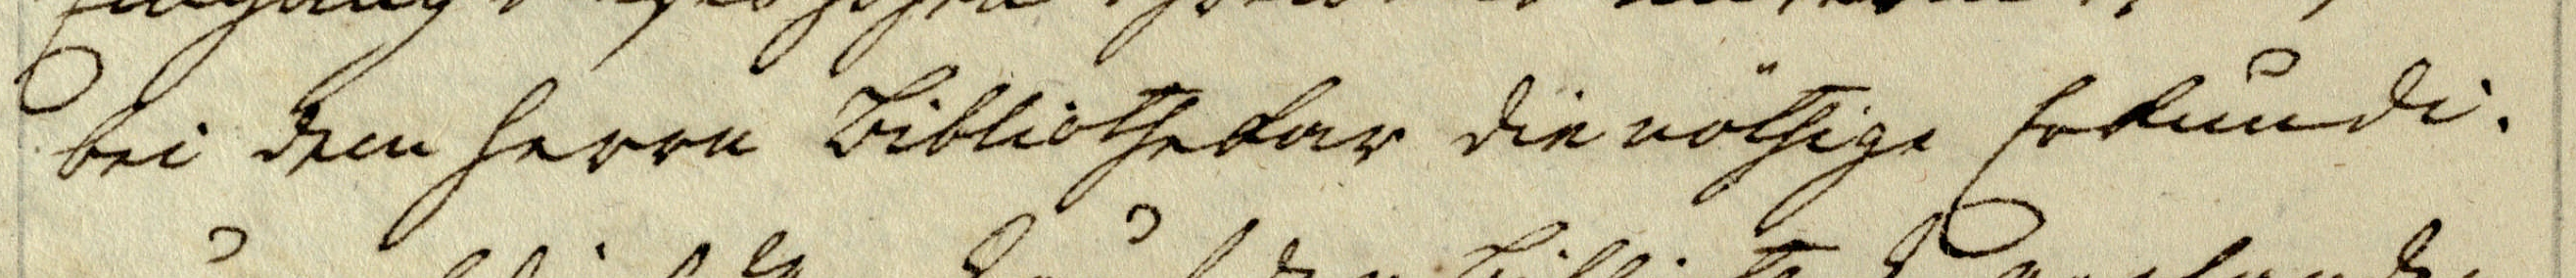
bei dem Herrn Bibliothekar die nöthige Erkundi¬
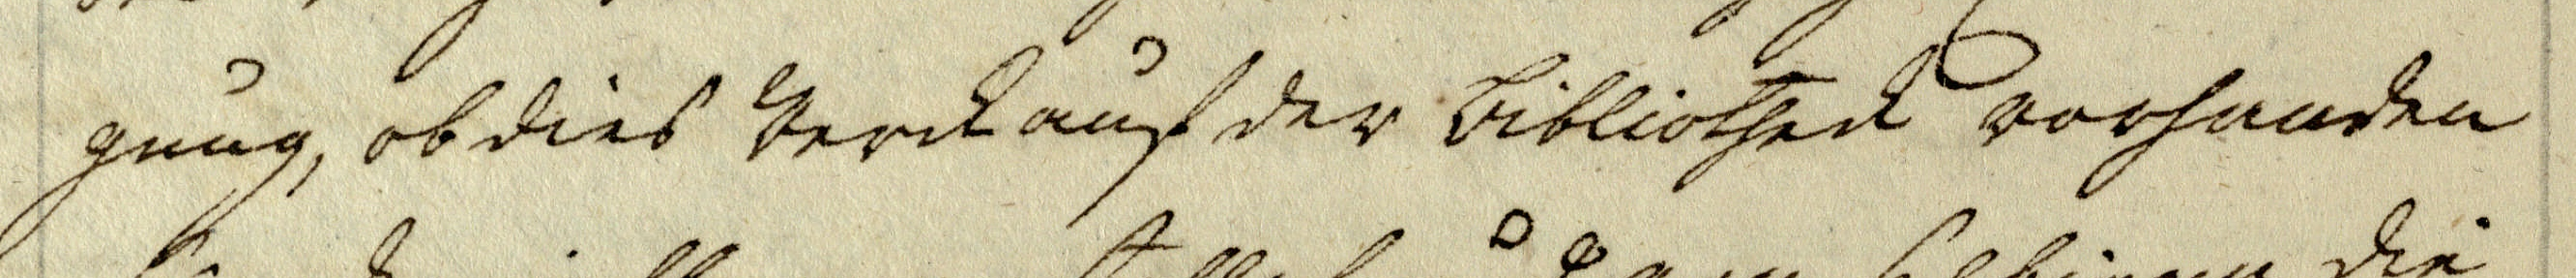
gung, ob dies Werck auf der Bibliotheck vorhanden
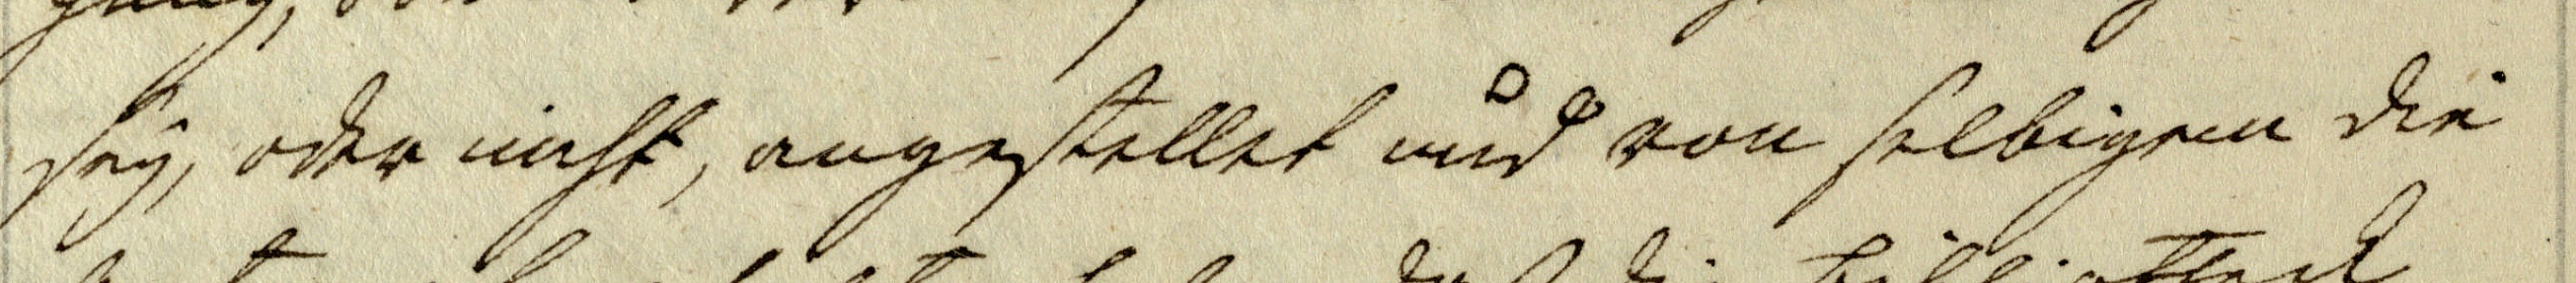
seÿ, oder nicht, angestellet und von selbigem die
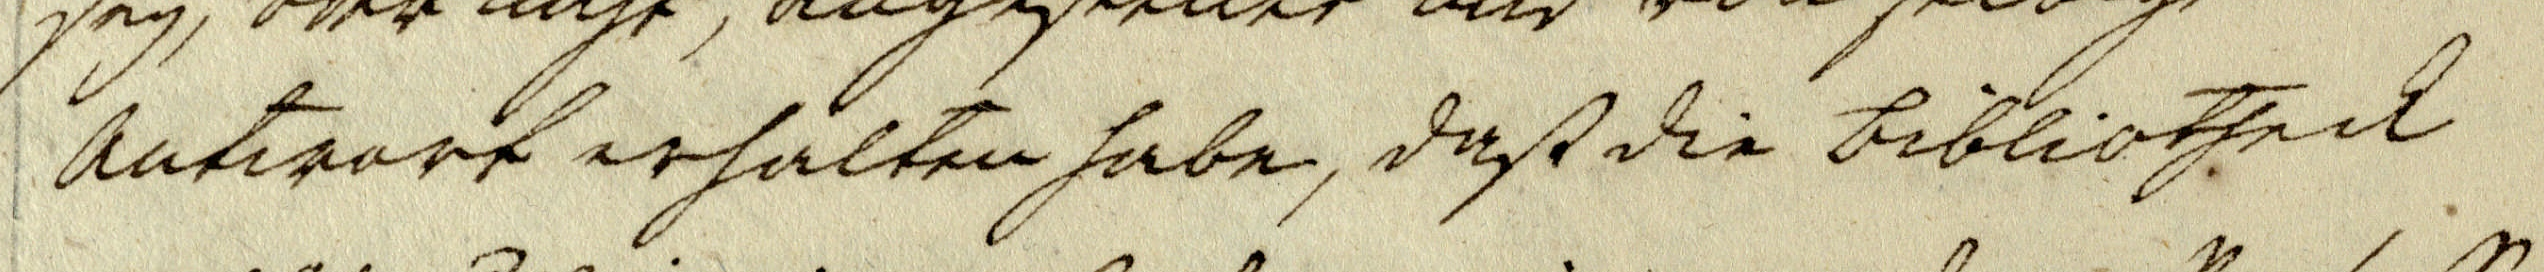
Antwort erhalten habe, daß die Bibliotheck
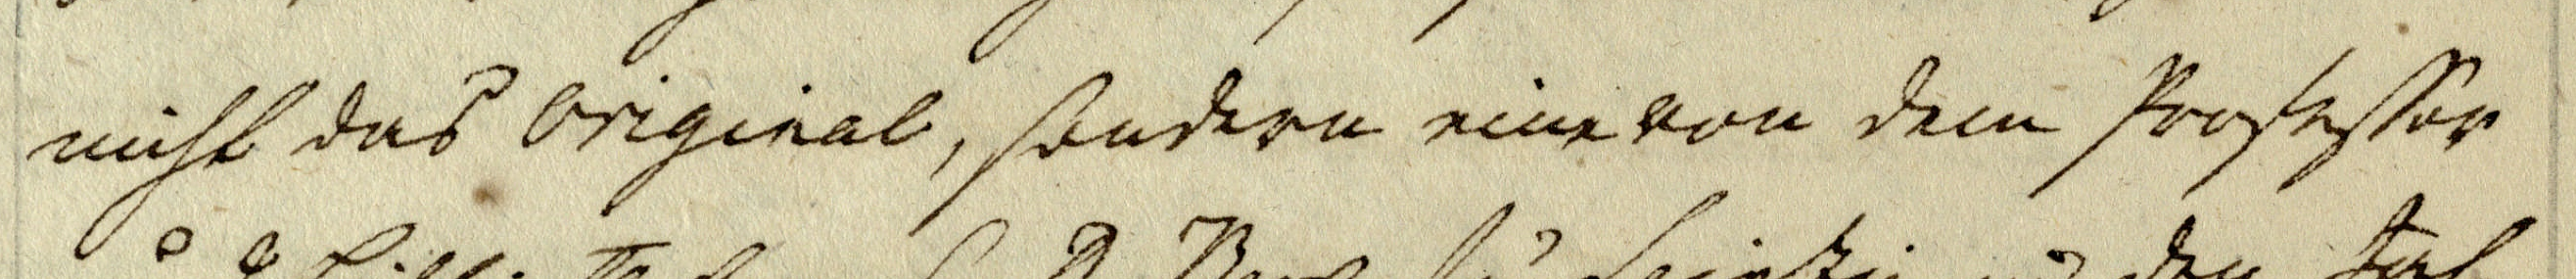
nicht das Original, sondern eine von dem Professor
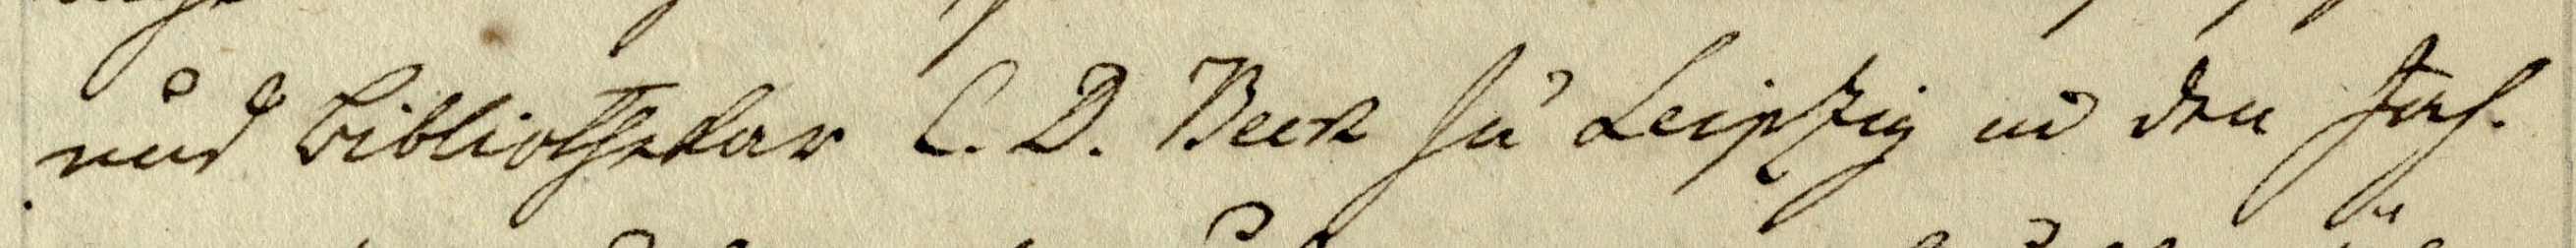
und Bibliothekar C. D. Beck zu Leipzig in den Jah¬
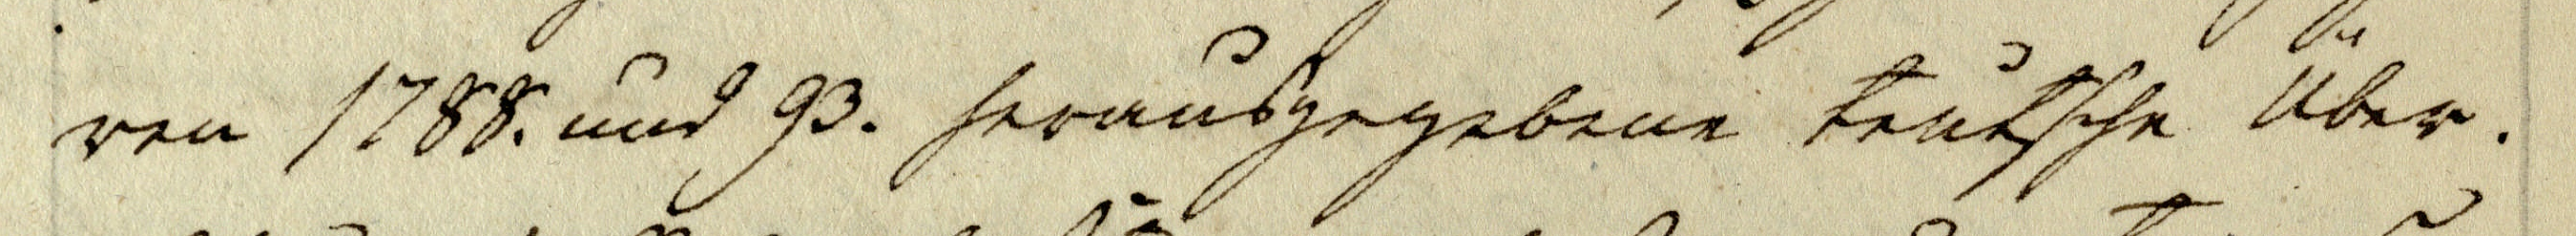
ren 1788. und 93. herausgegebene teutsche Über¬
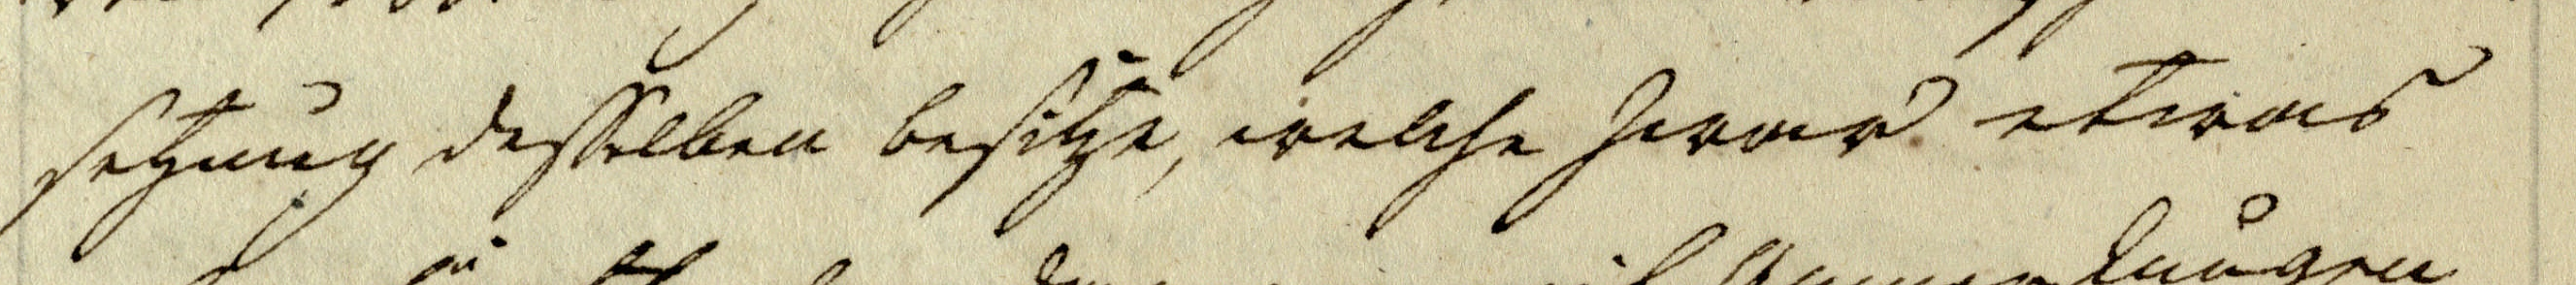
setzung desselben besitze, welche zwar etwas
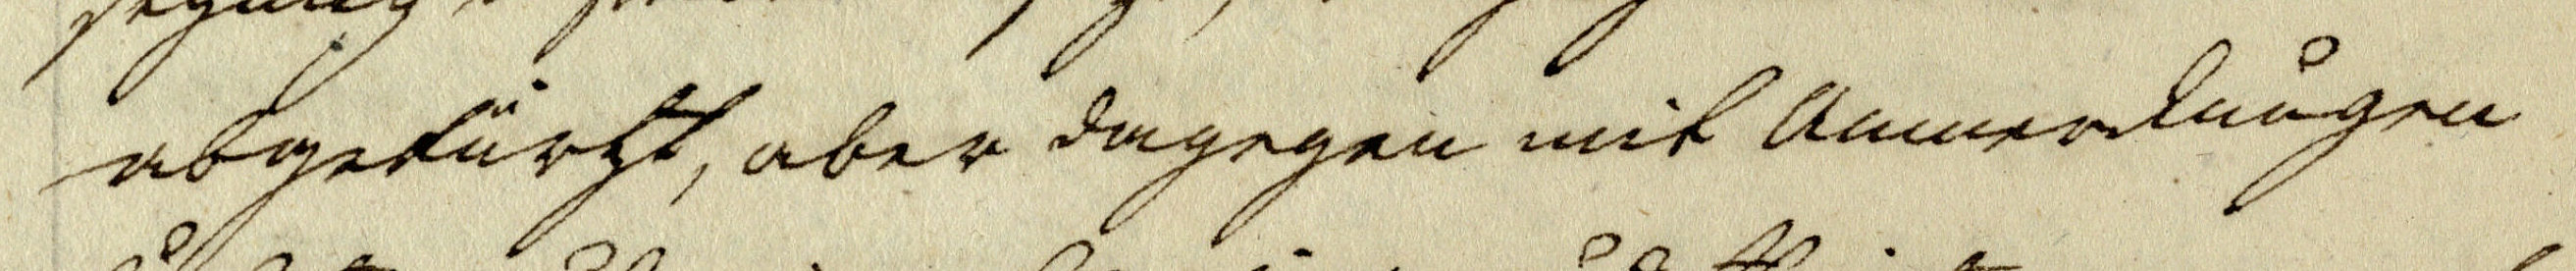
abgekürtzt, aber dagegen mit Anmerckungen
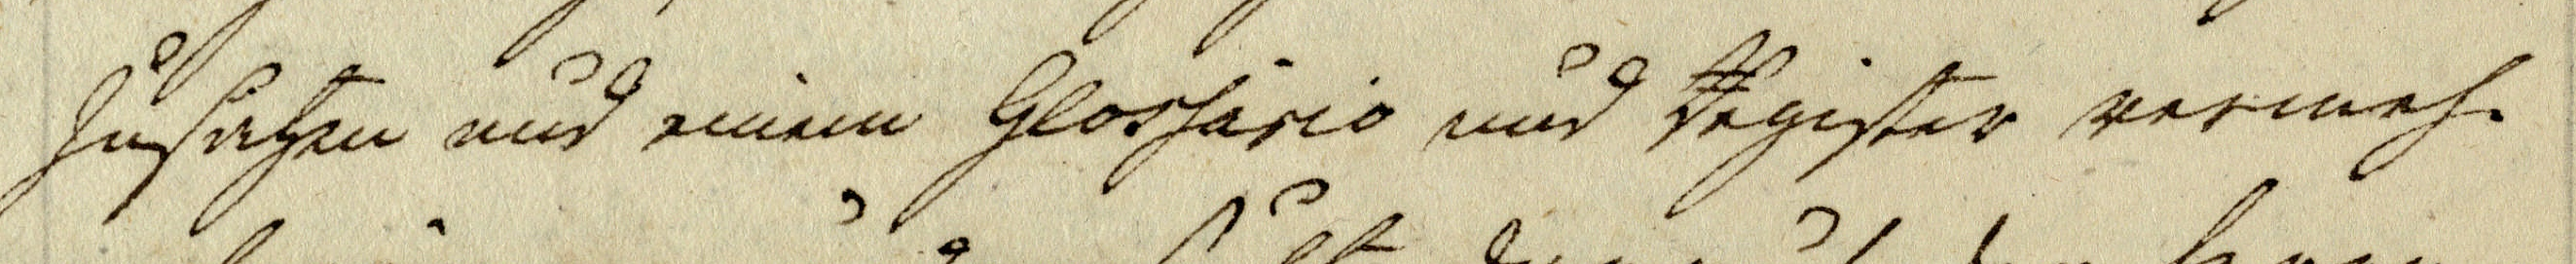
Zusatzen und einem Glossario und Register vermeh¬
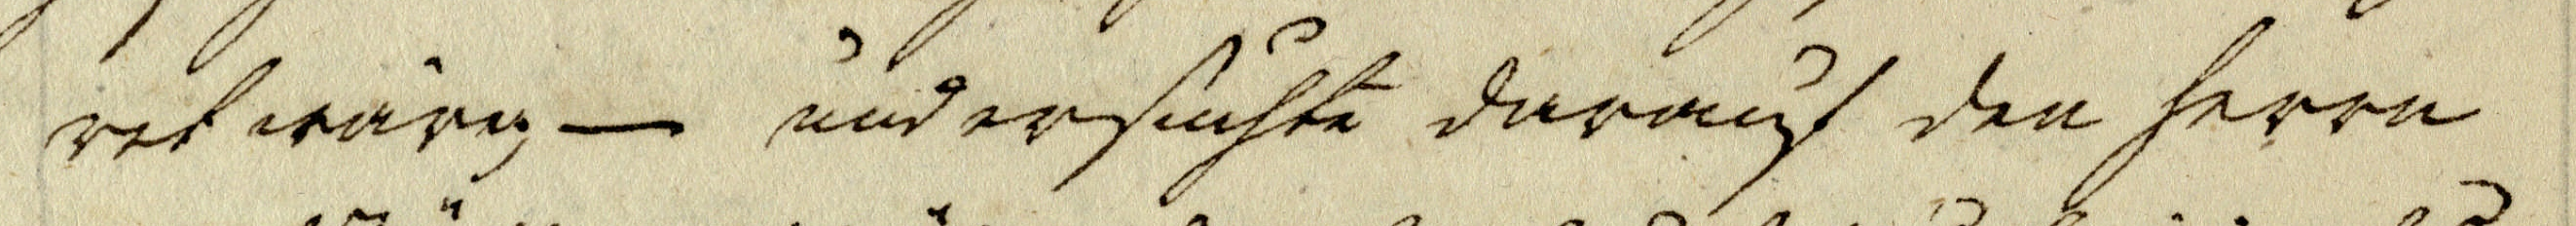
ret wäre - und ersuchte darauf den Herrn
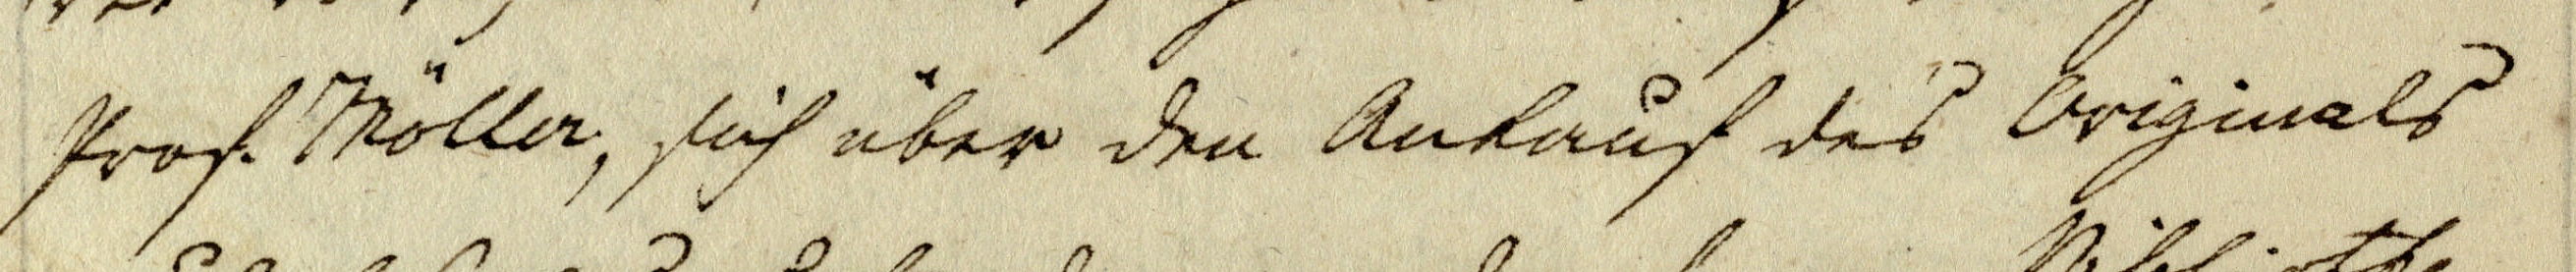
Prof. Möller, sich über den Ankauf des Originals
